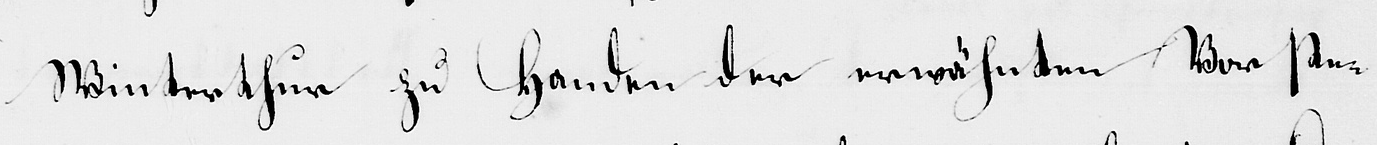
Winterthur zu Handen der erwähnten Vorste¬
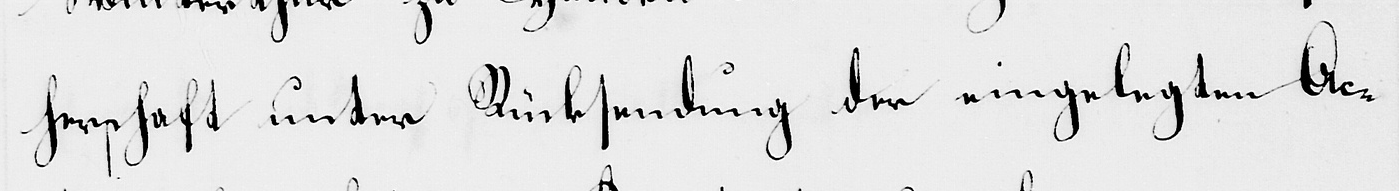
herschaft unter Rücksendung der eingelegten Ac¬
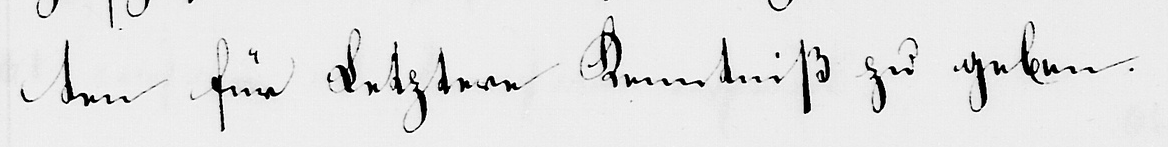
ten für Letztern Kenntniß zu geben.
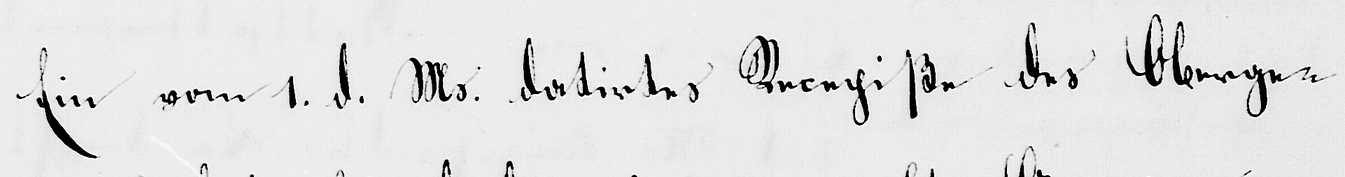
Ein vom 1. d. Ms datirtes Recepiße des Oberge¬
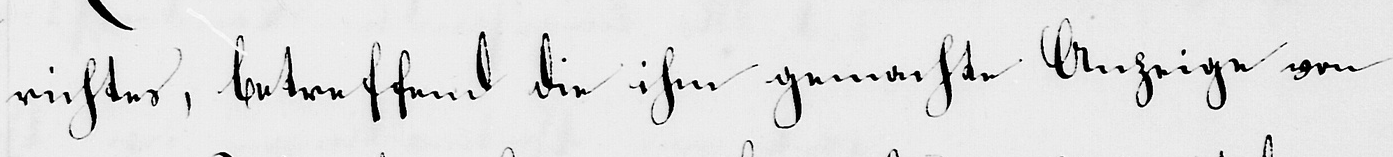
richtes, betreffend die ihm gemachte Anzeige von
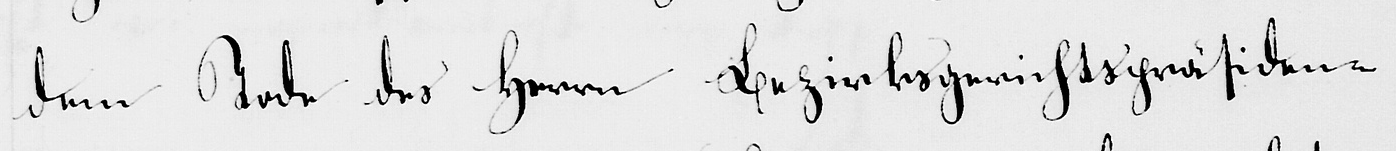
dem Tode des Herrn Bezirksgerichtspräsiden¬
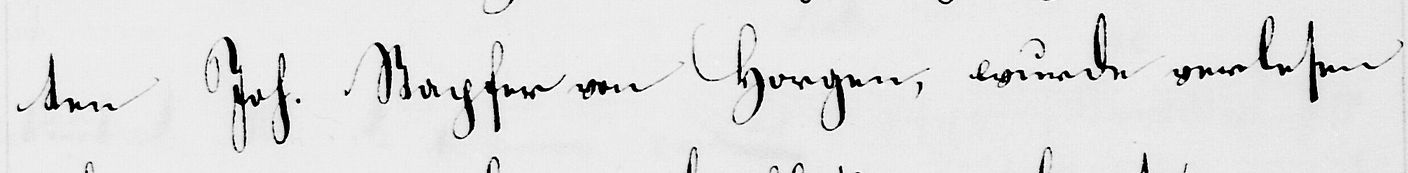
ten Joh. Stapfer von Horgen, wurde verlesen
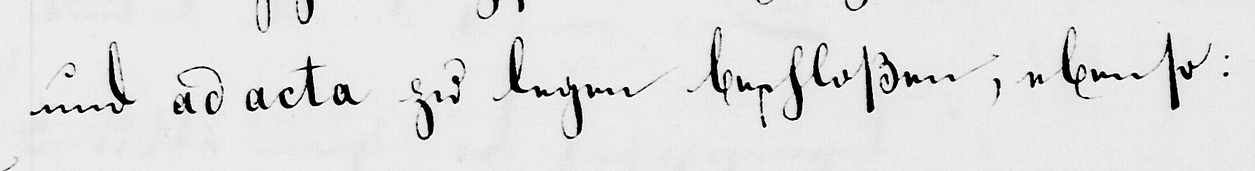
und ad acta zu legen beschloßen, ebenso:
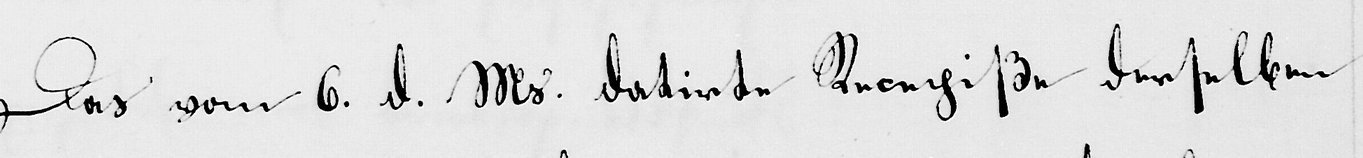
Das vom 6. d. Ms. datirte Recepiße derselben
